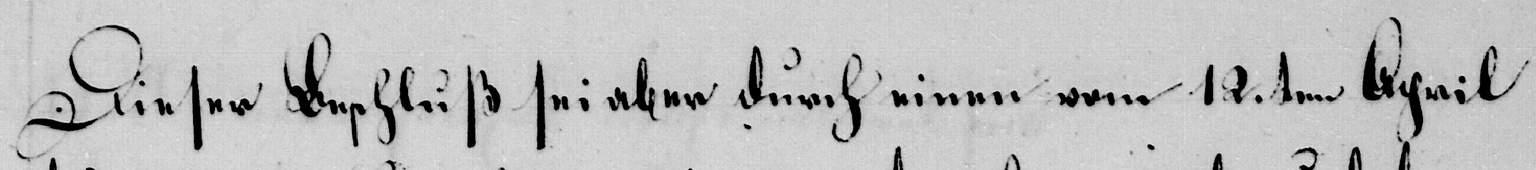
Dieser Beschluß sei aber durch einen vom 12.ten April
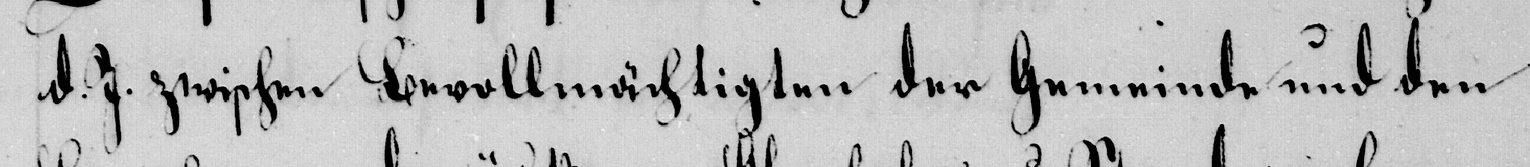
d. J. zwischen Bevollmächtigten der Gemeinde und den
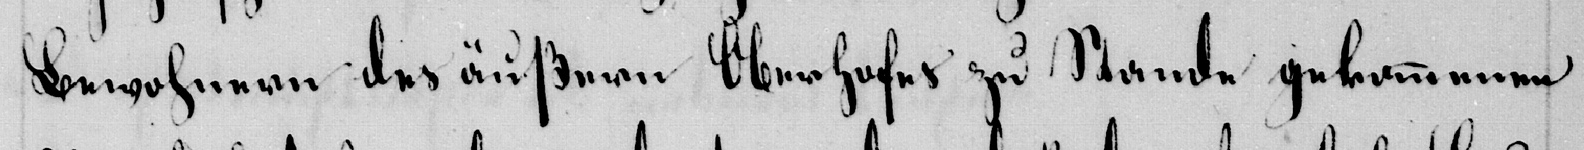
Bewohnern des äußern Oberhofes zu Stande gekommenen
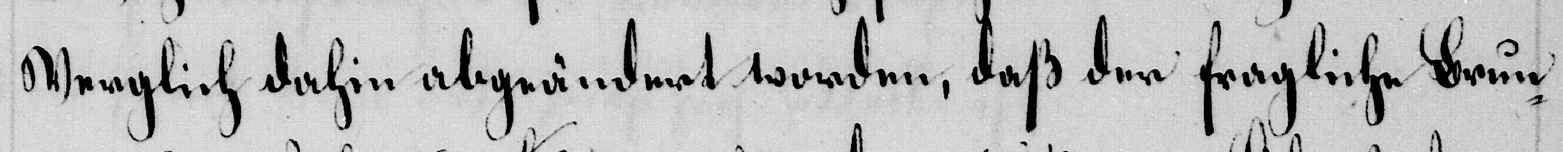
Verglich dahin abgeändert worden, daß der fragliche Brun¬
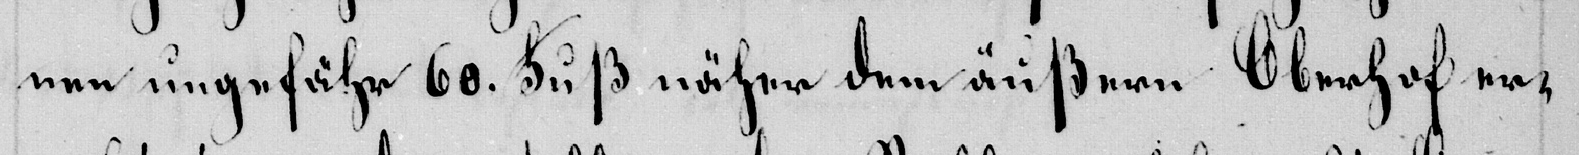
nen ungefähr 60. Fuß näher dem äußern Oberhof er¬
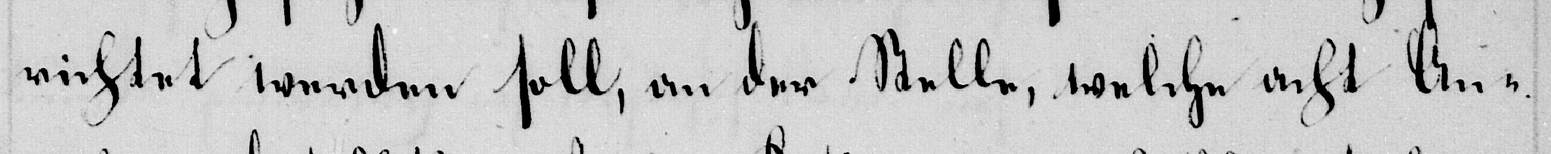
richtet werden soll, an der Stelle, welche acht An¬
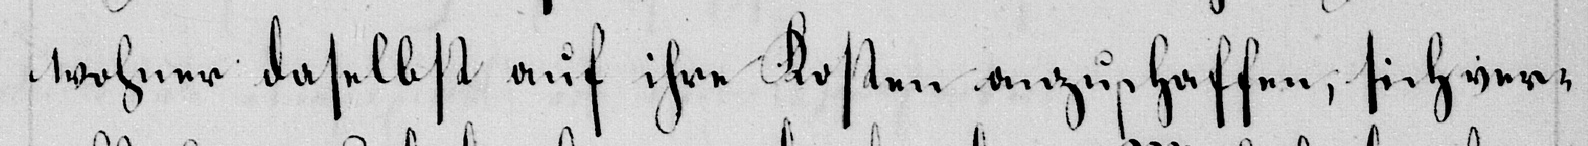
wohner daselbst auf ihre Kosten anzuschaffen, sich ver¬
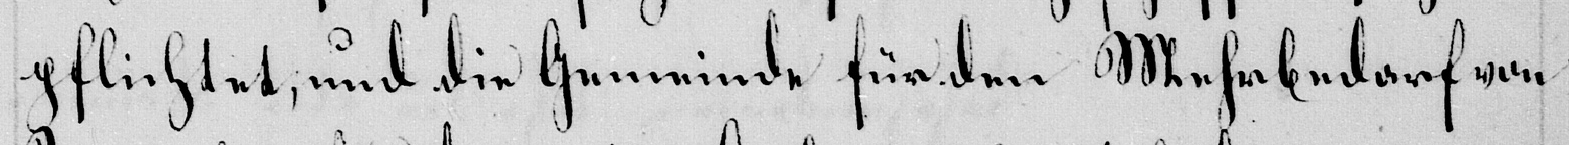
pflichtet, und die Gemeinde für den Mehrbedarf von
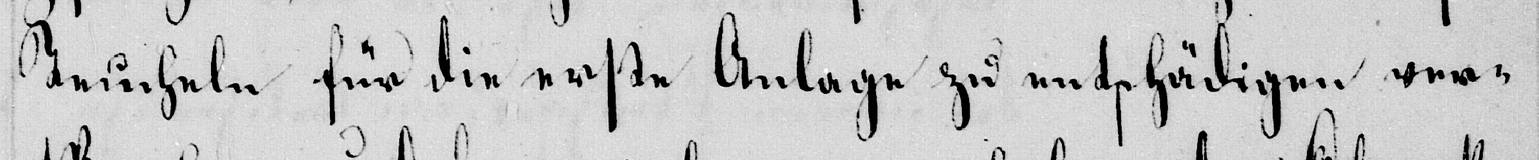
Teucheln für die erste Anlage zu entschädigen ver¬
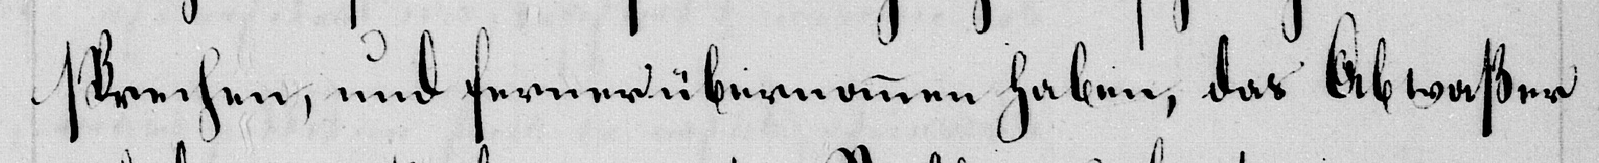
sprechen, und ferner übernommen haben, das Abwaßer
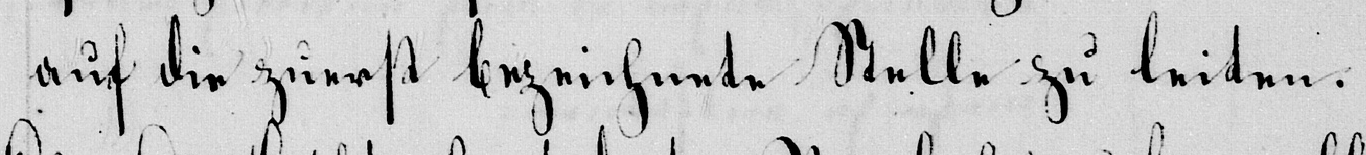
auf die zuerst bezeichnete Stelle zu leiten.
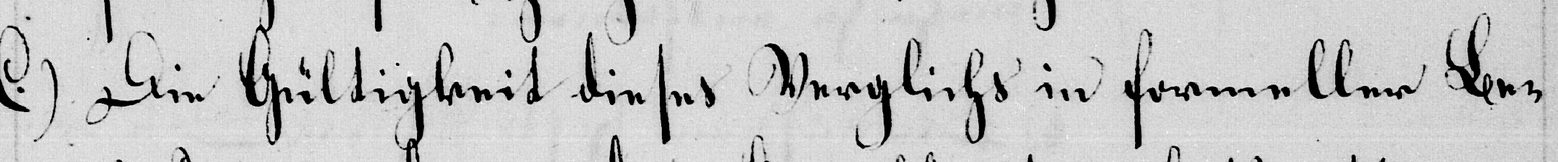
C.) Die Gültigkeit dieses Verglichs in formeller Be¬
